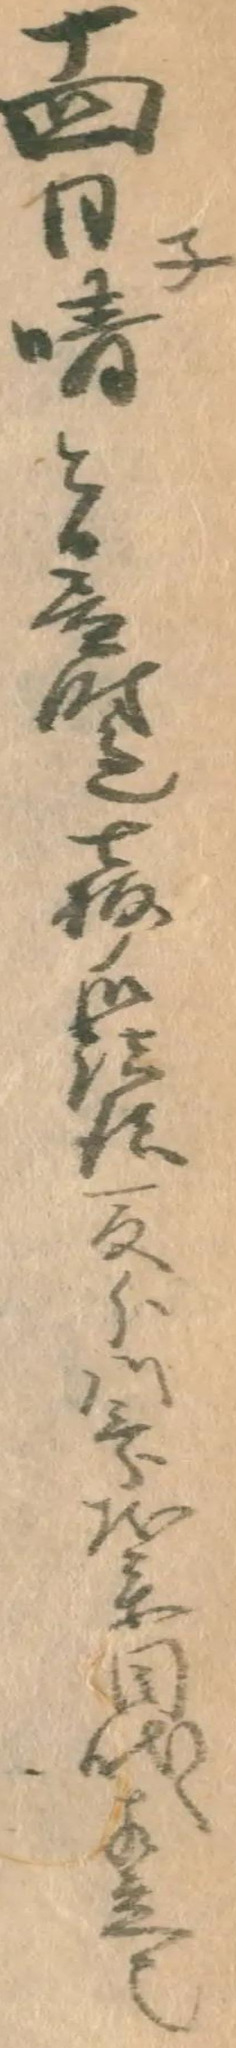十四日子晴今日昼時過七板の御結鎮一反分門三郎持参目代へ相立也
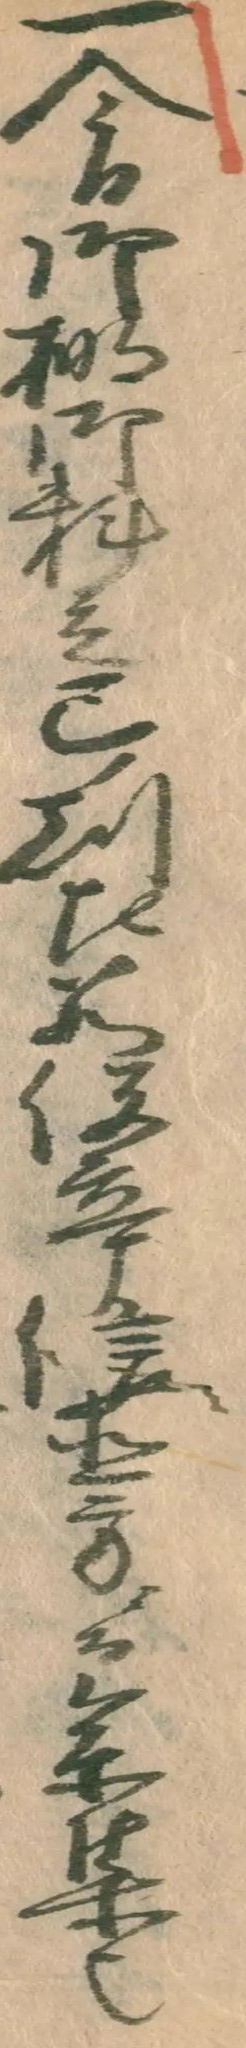一今日御棚御料立巳ノ刻比若役亭信直方ニ而参集也
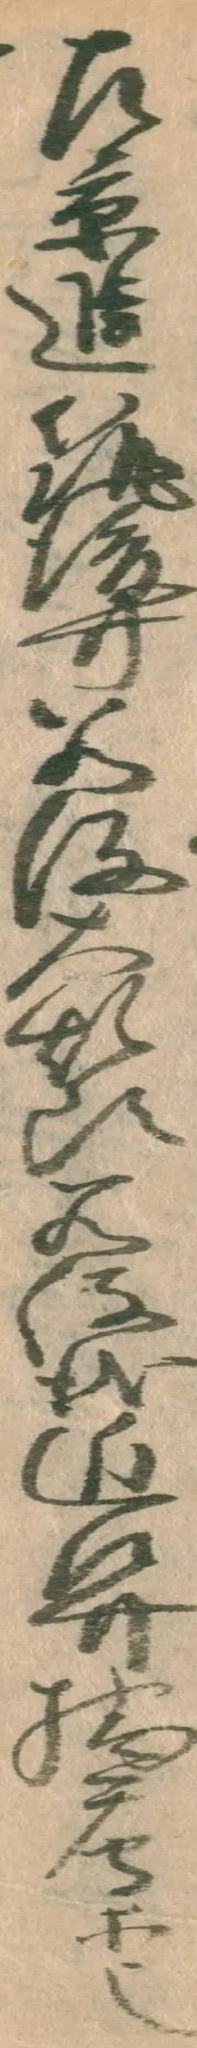左京進筑後介若役大炊頭若役代近江介播磨守等也
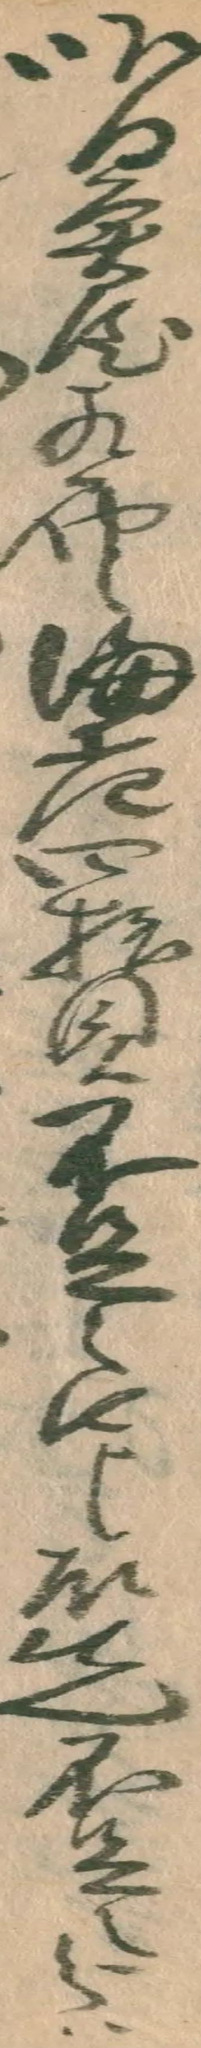昨日魚屋相届候海老四拾目ハ不足之由申候故先不足之分ハ
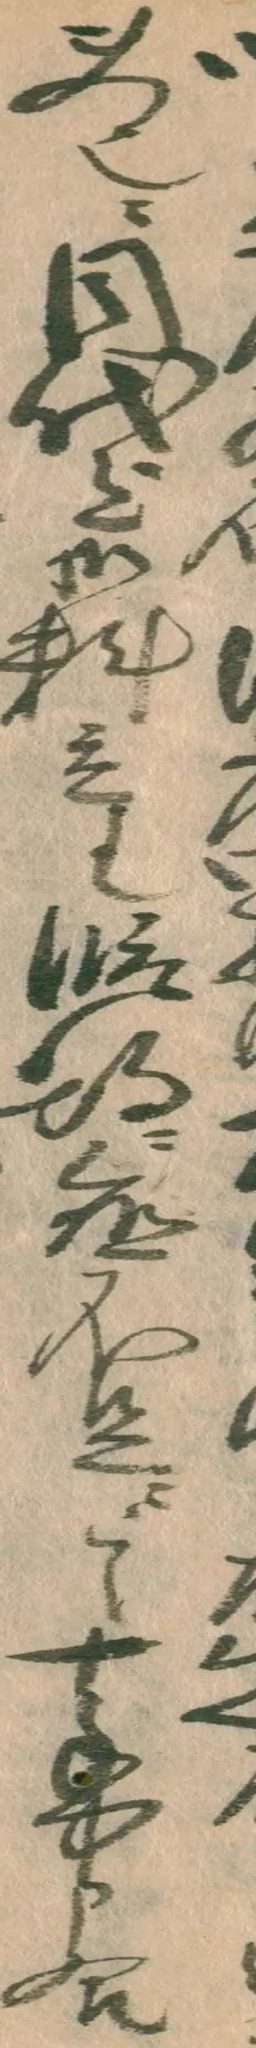夫也ニ目代迄御料立も段ニ愈不足ニ候ハヽ十手中申合
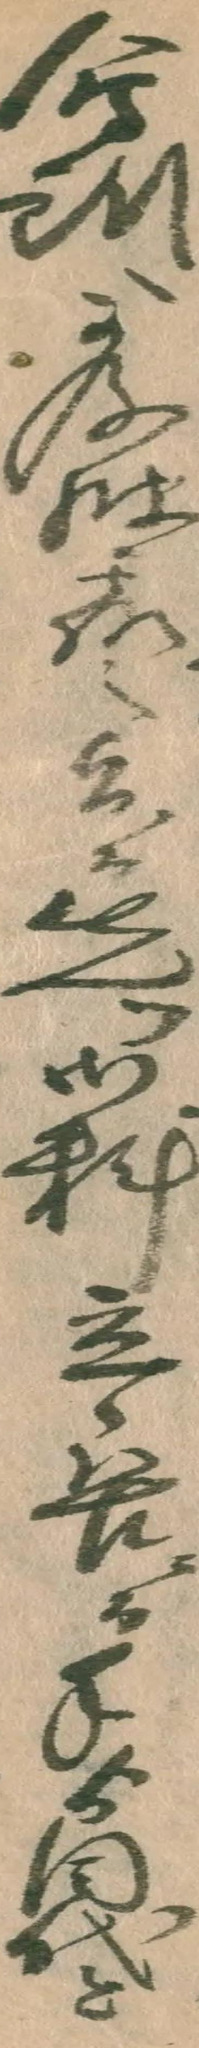会所へ可及吐露之旨ニ而先ツ御料立候筈ニ而手ゟ目代と
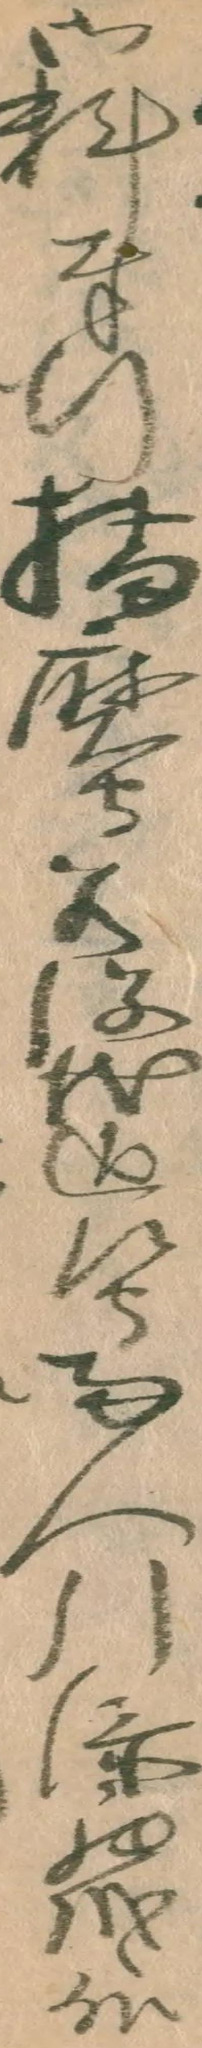御料奉行播磨守若役代近江守両人引添罷越候処
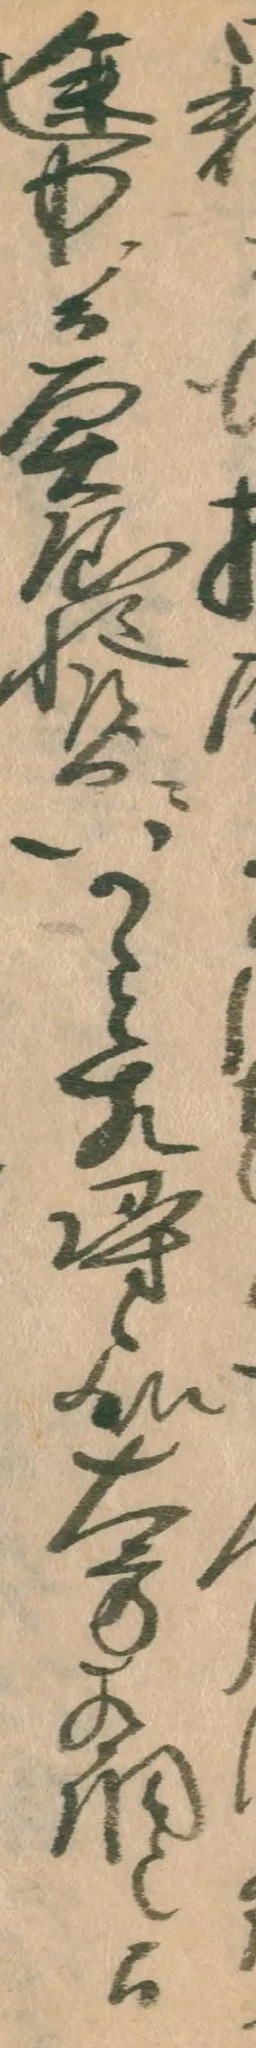途中ニ而魚屋権左衛門ニいかゝと相得候処大方相調候間
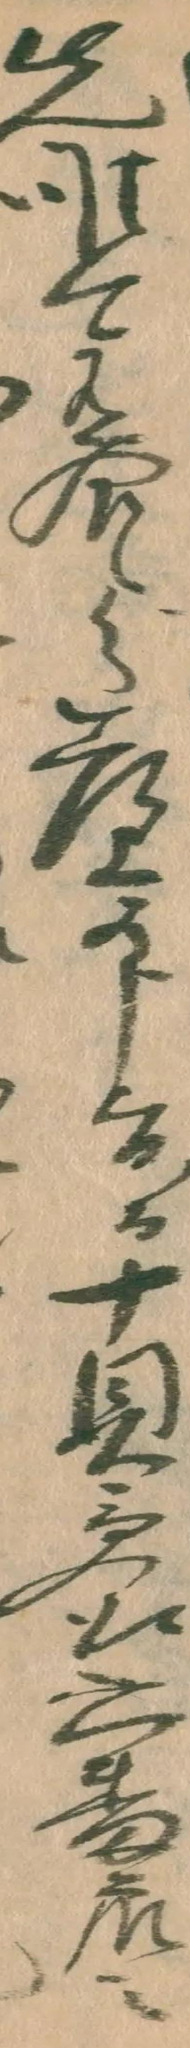先唯今有合候分差上可申旨ニ而十貝受取六番衆之
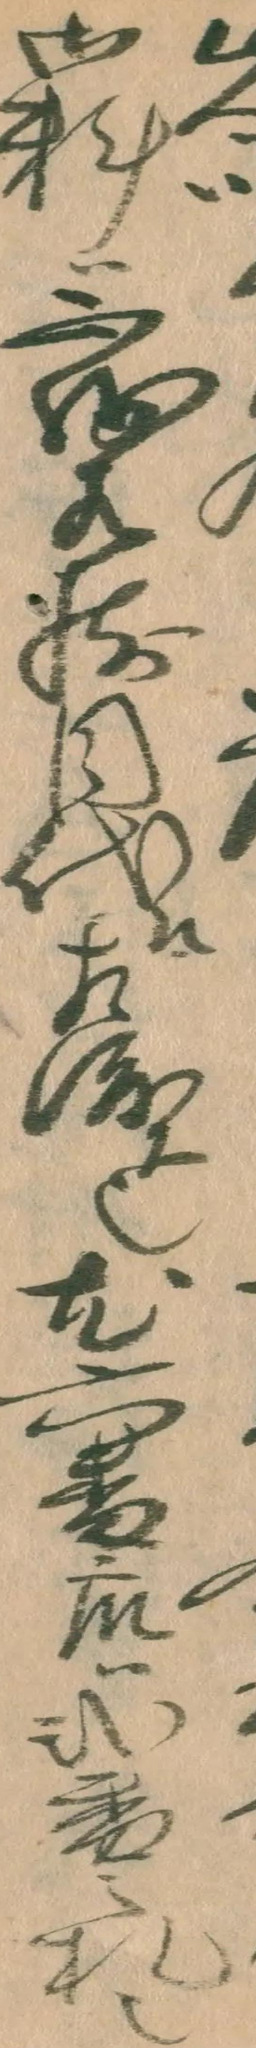御料ハ不残相揃目代江相渡ス也尤六番衆ハ弐番之札也
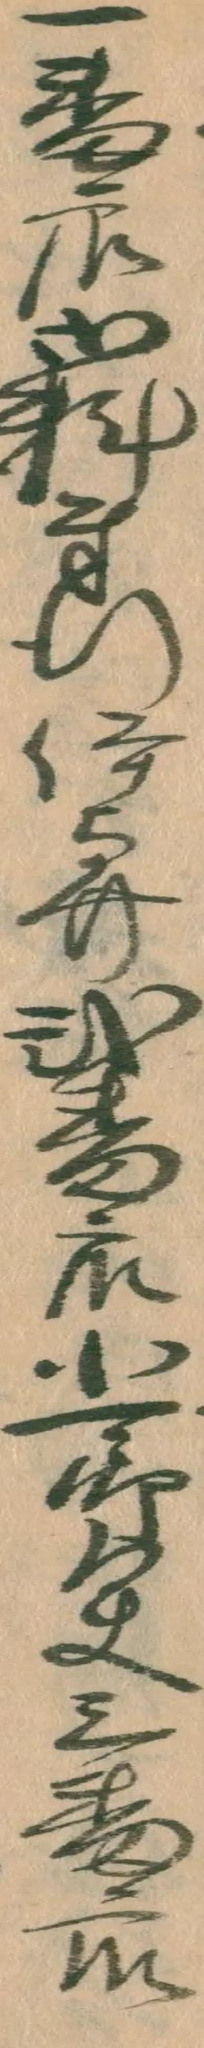一番衆御料奉行伊与介弐番衆小一郎大夫三番衆
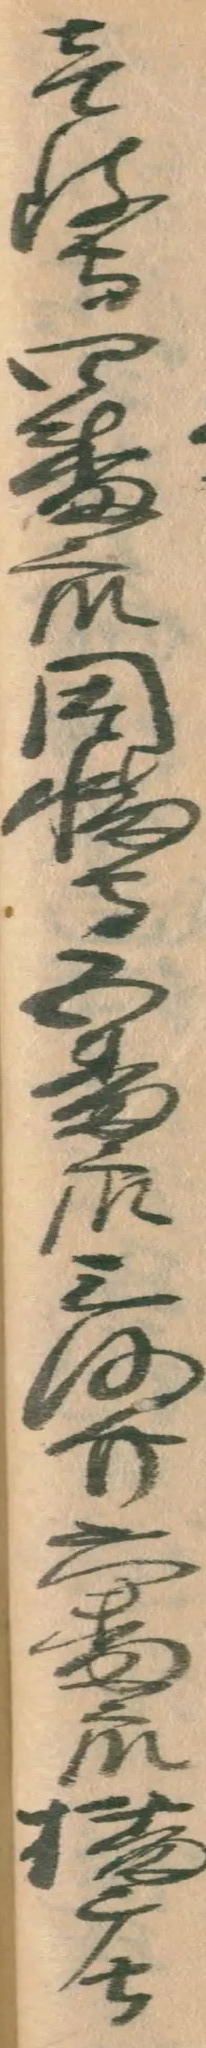壱岐守四番衆因幡守五番衆三河介六番衆播磨守
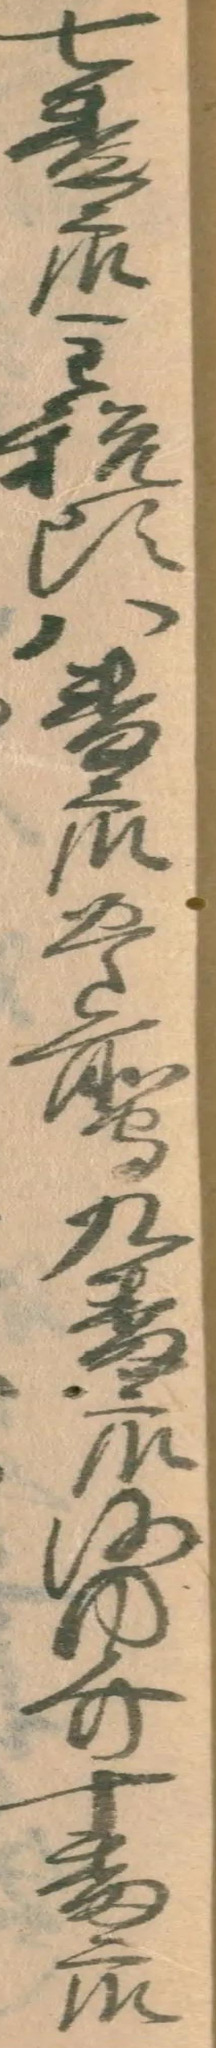七番衆主税頭八番衆豊前守九番衆河内介十番衆
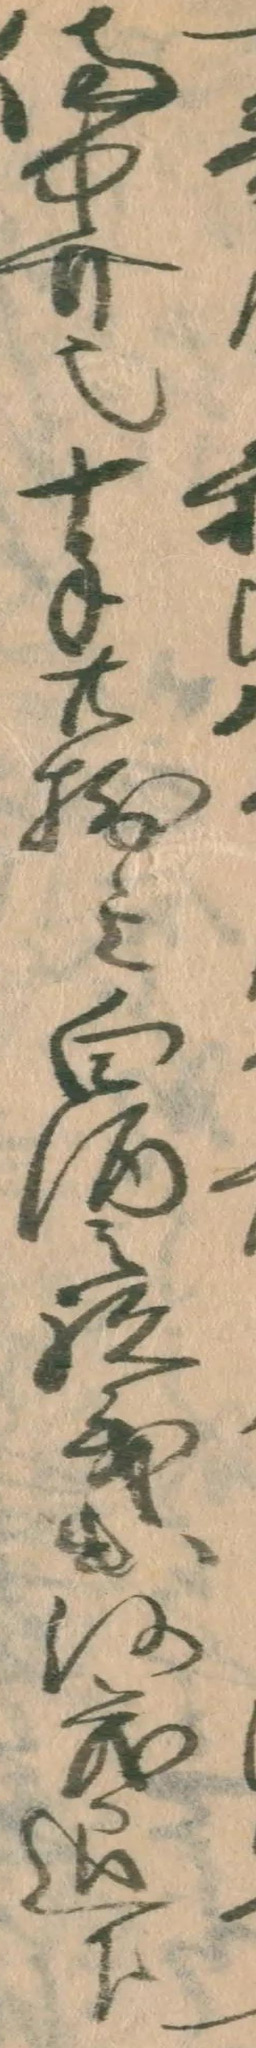備中介也十手共揃候上白酒之祝義出何も退下
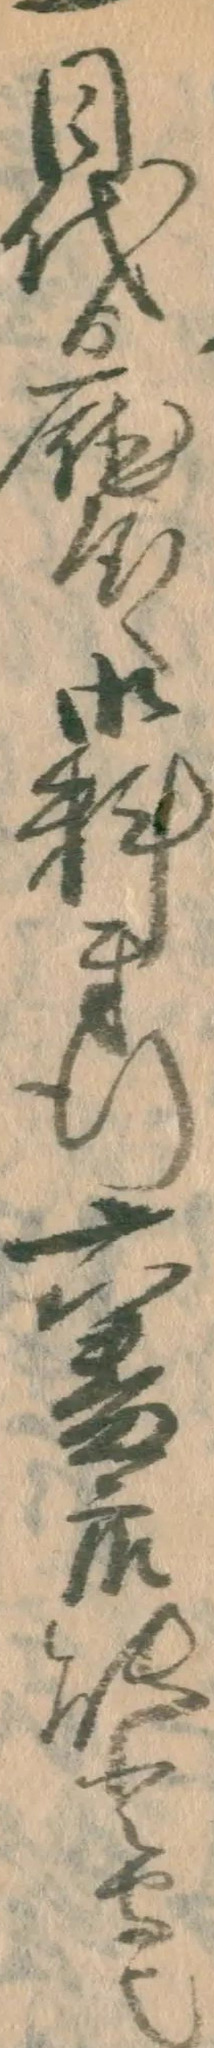一目代ゟ庁屋へ御料奉行六番衆能登守也
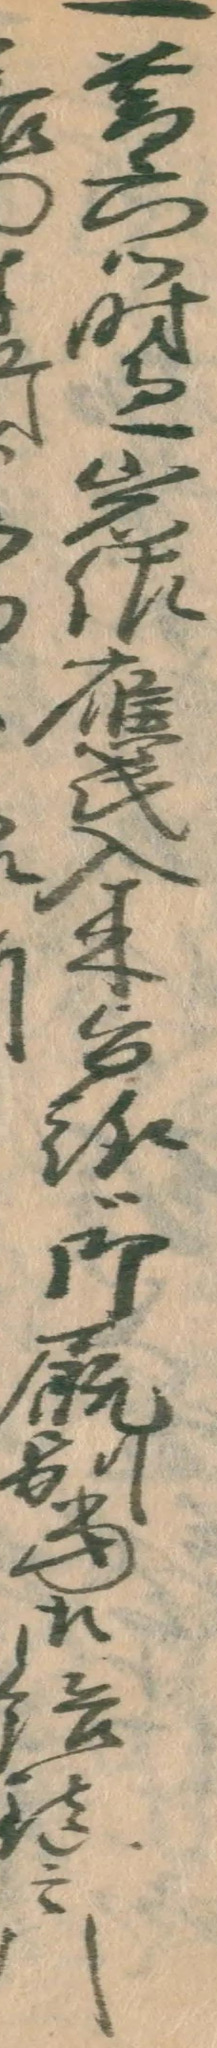一暮六ツ時過岩佐応氏入来旨趣ハ御厩別当御結鎮之引
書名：賀茂社記録. 第60冊
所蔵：国立国会図書館 National Diet Library, JAPAN
